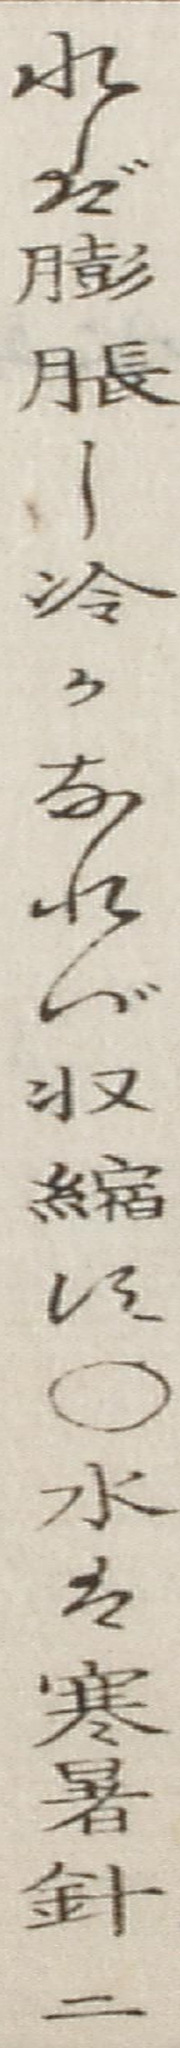れば膨張し冷かなれば収縮す○水は寒暑針二
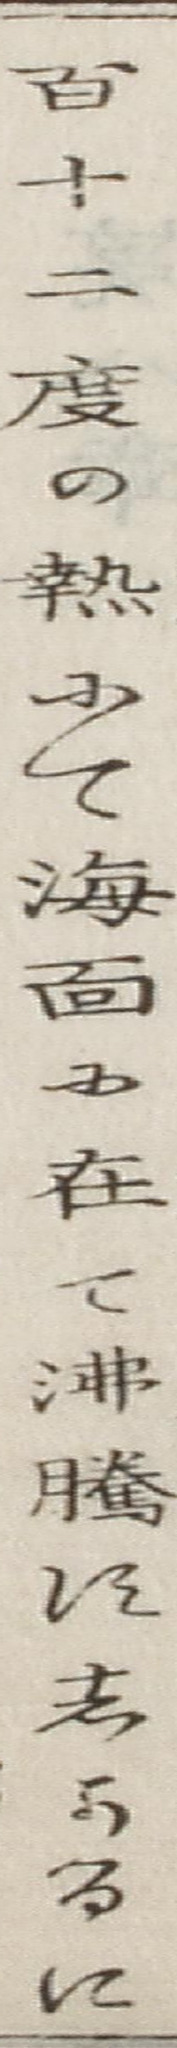百十二度の熱にて海面に在て沸騰すしかるに
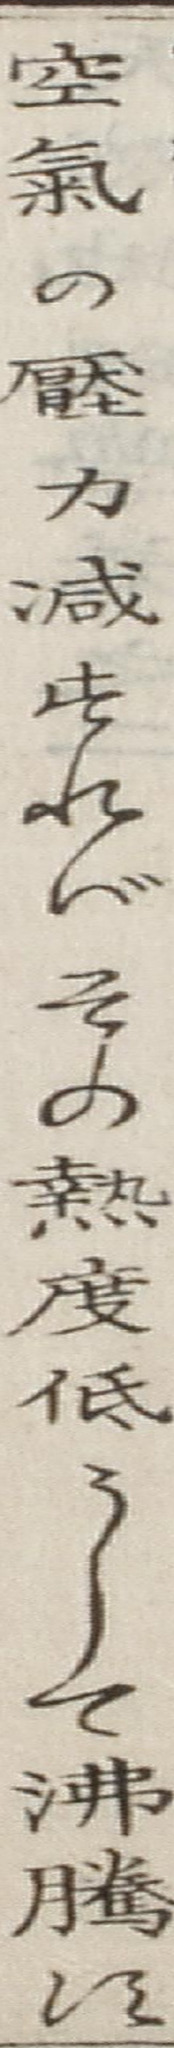空気の圧力減すればその熱度低うして沸騰す
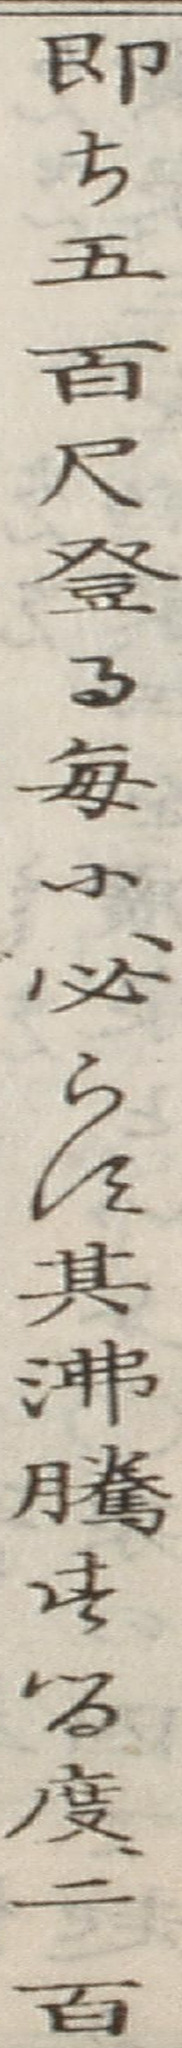即ち五百尺登る毎に、必らす其沸騰する度二百
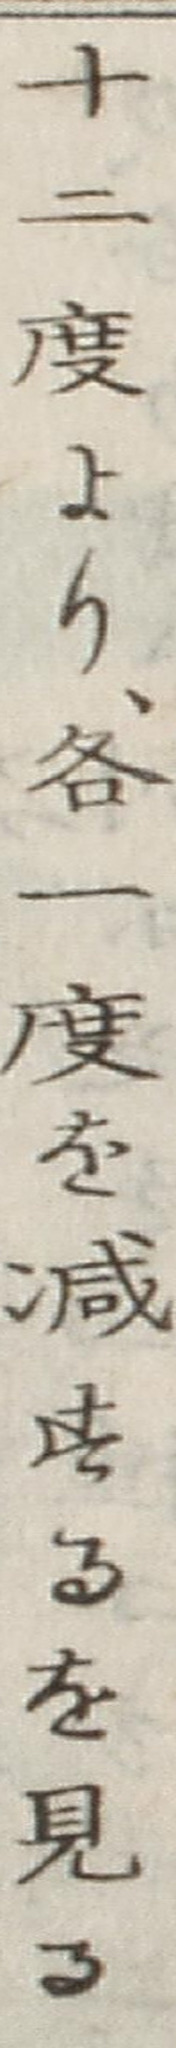十二度より、各一度を減するを見る
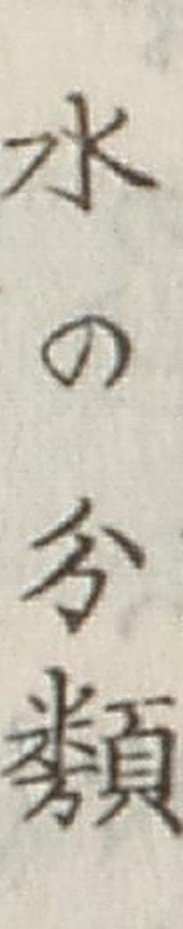水の分類
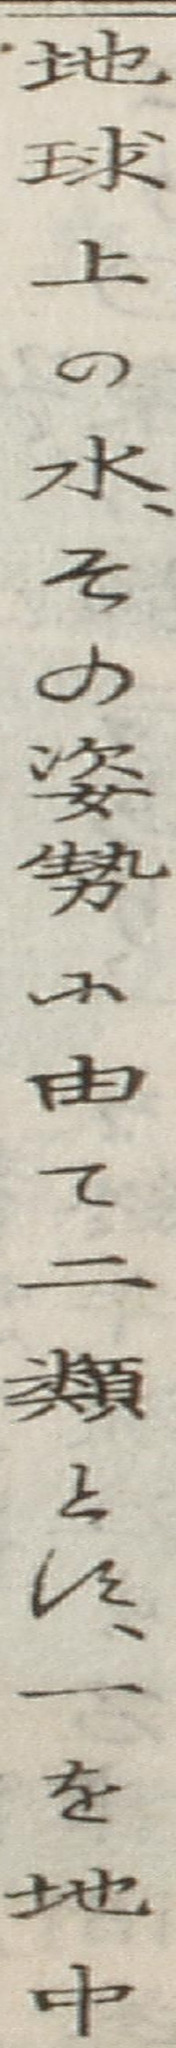地球上の水、その姿勢に由て二類とす、一を地中
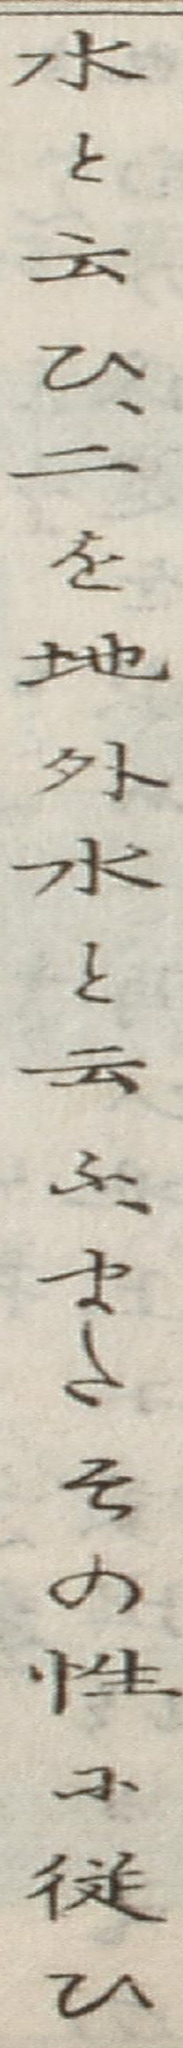水と云ひ、二を地外水と云ふ、またその性に従ひ
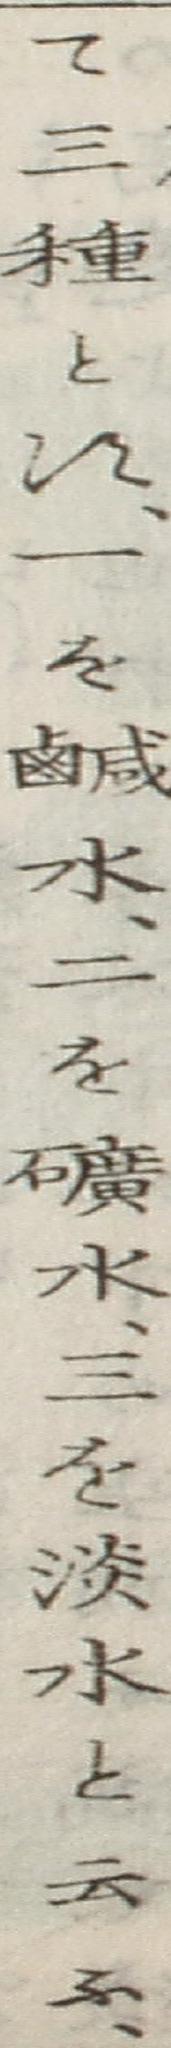て三種とす、一を鹹水、二を礦水、三を淡水と云ふ、
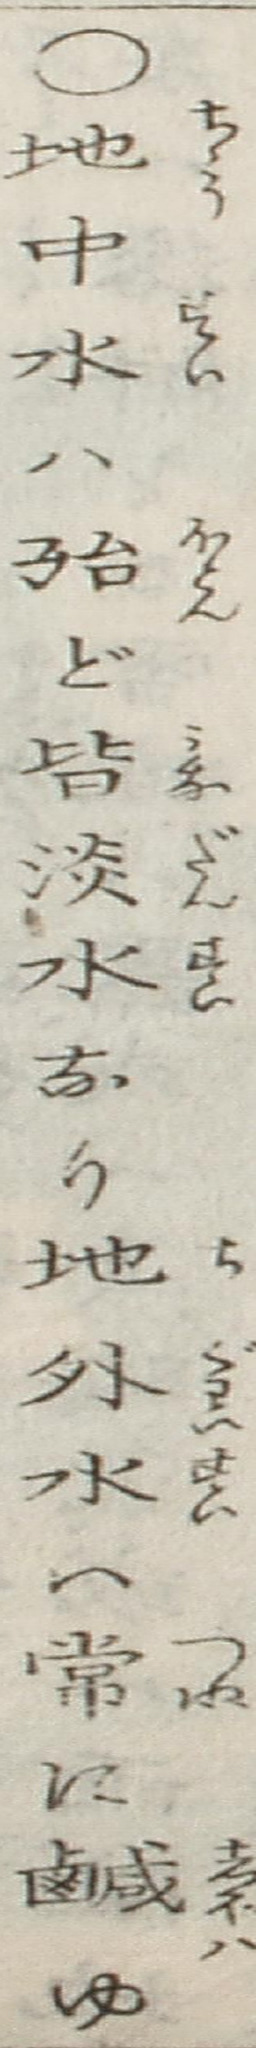○地中水は殆ど皆淡水なり地外水は常に鹹ゆ
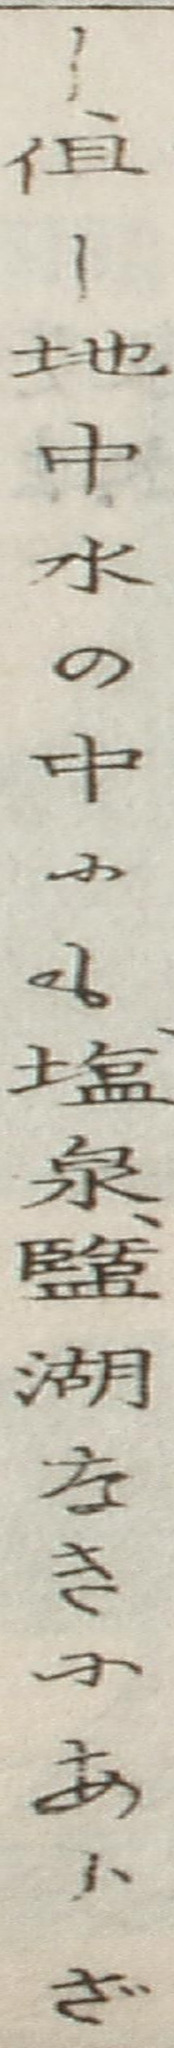し、但し地中水の中にも塩泉鹽湖なきにあらざ
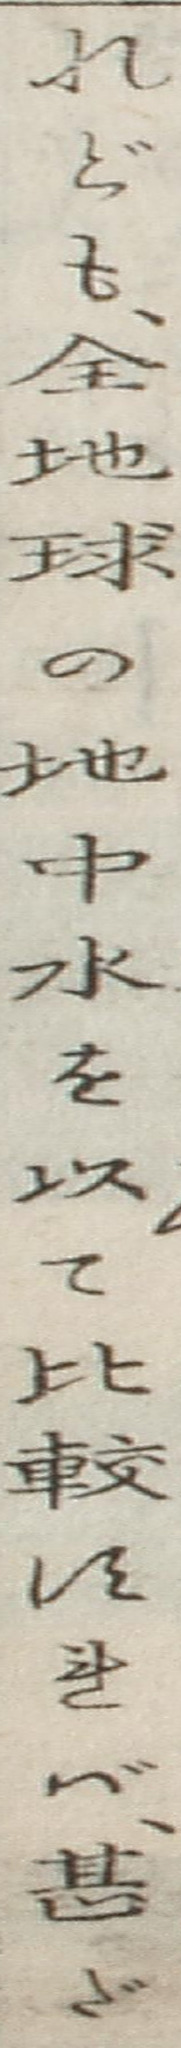れども、全地球の地中水を以て比較すれば、甚だ

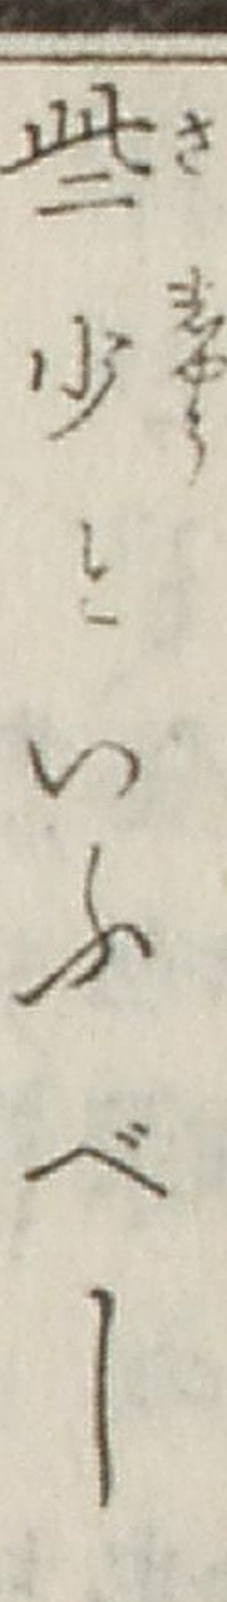些少といふべし
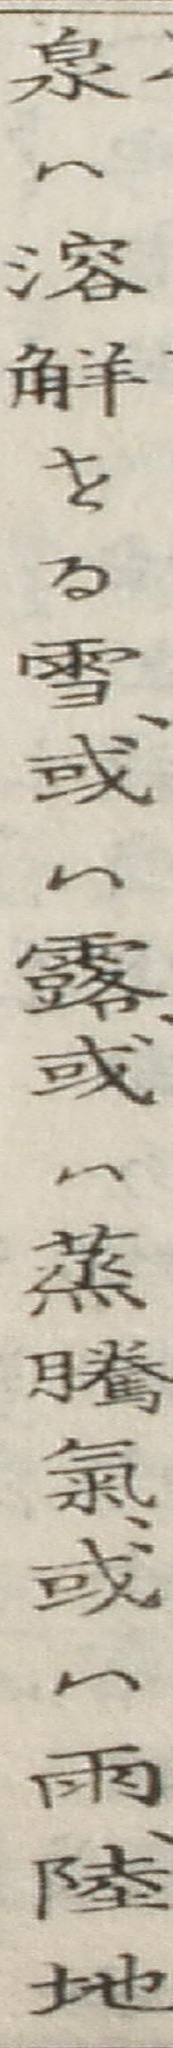泉は溶解する雪或は露或は蒸騰気或は雨陸地
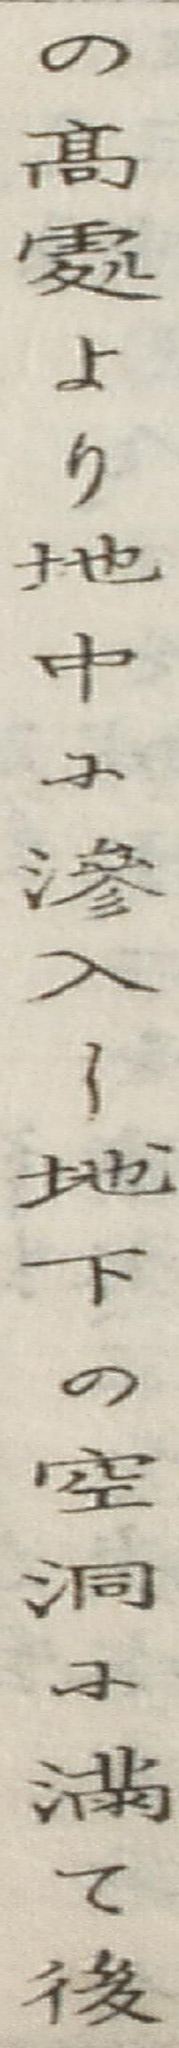の高処より地中に滲入し地下の空洞に満て後
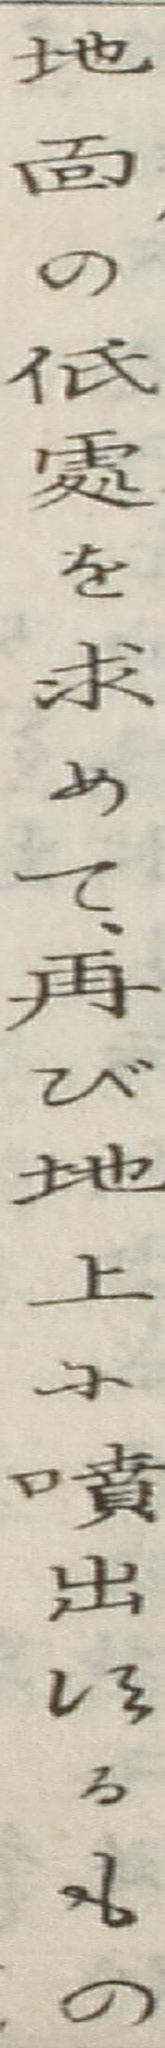地面の低処を求めて再び地上に噴出するもの
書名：訓蒙　天然地理學　中
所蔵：東京大学地震研究所図書室 Earthquake Research Institute Library, The University of Tokyo, JAPAN
